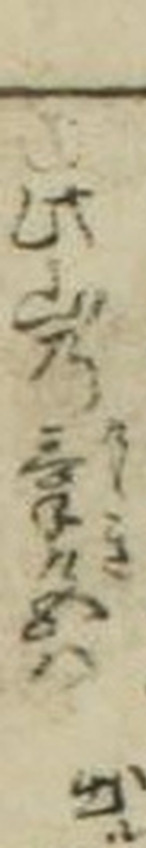〇此山の気色は
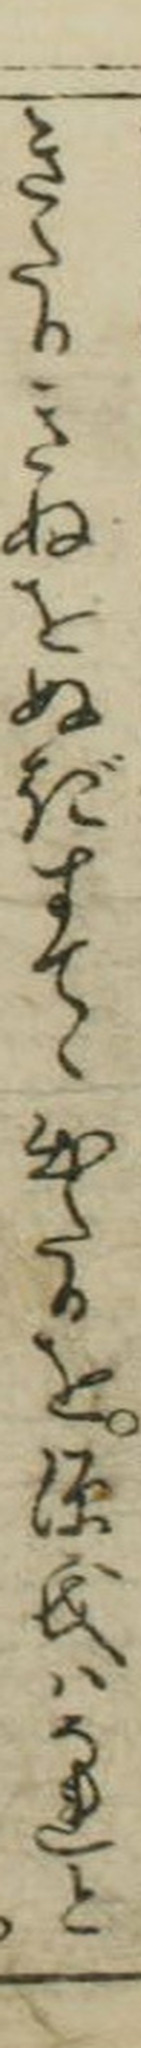きたるきぬをぬぎすてゝ出たるを。源氏はそれと
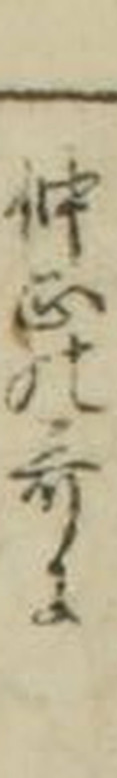仲正の哥に
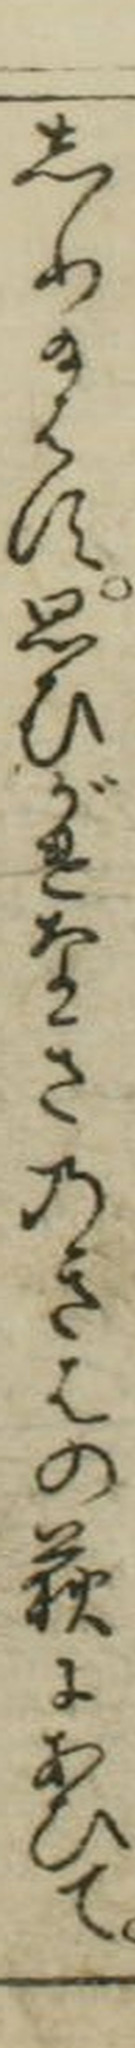しり給はす。思ひがけなきのきはの荻にあひて。
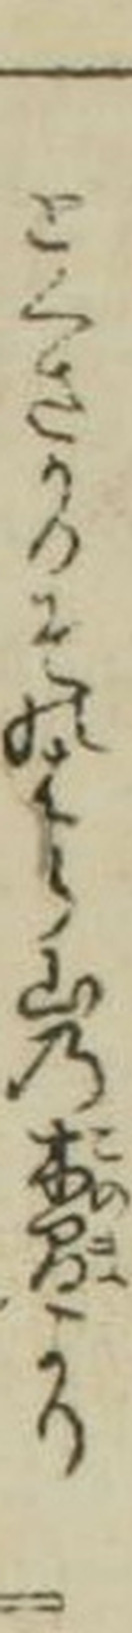とくさかりそのはら山の木間より
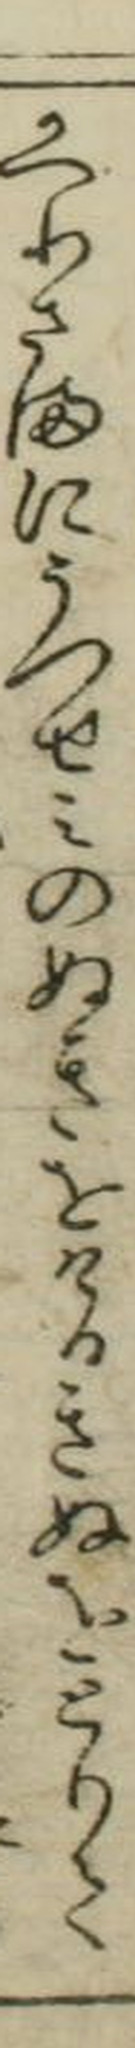かへりさまにうつせみのぬきをけるきぬをとりて
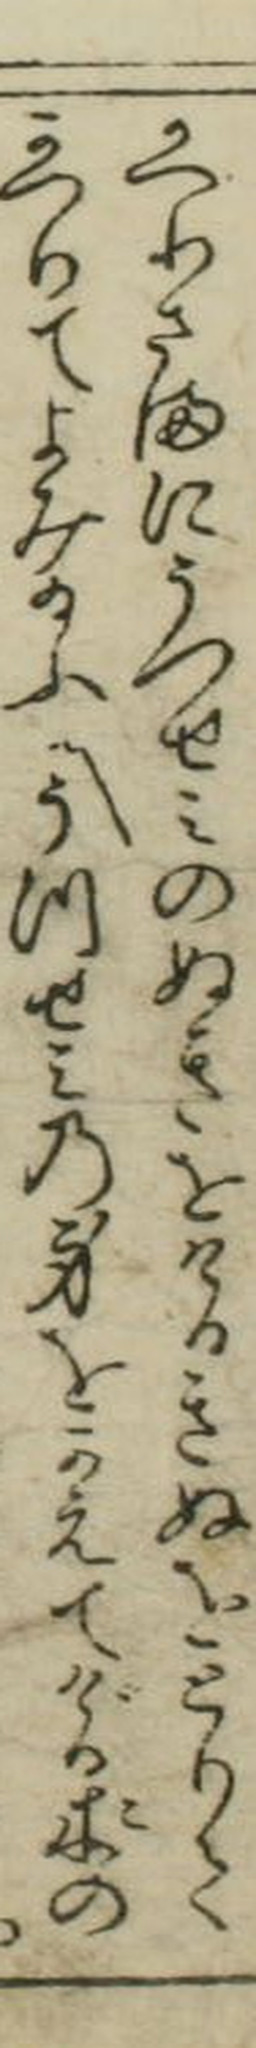かへりてよみ給ふ〽うつせみの身をかえてげる木の
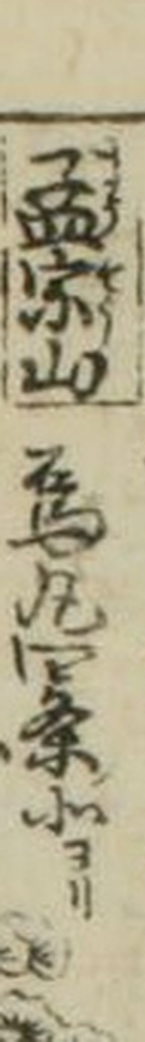孟宗山烏丸四条北
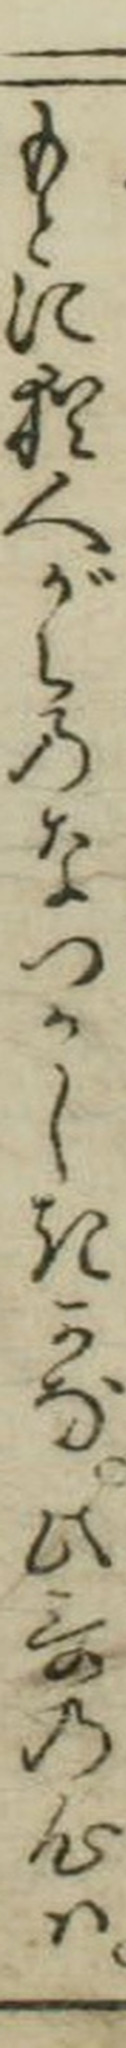もとに猶人がらのなつかしきかな。此哥の心は。
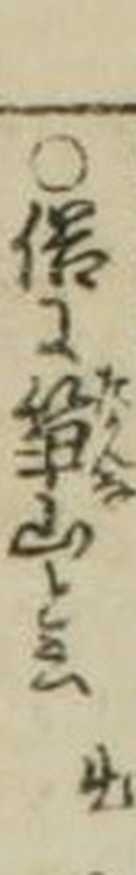〇俗に筍山と云
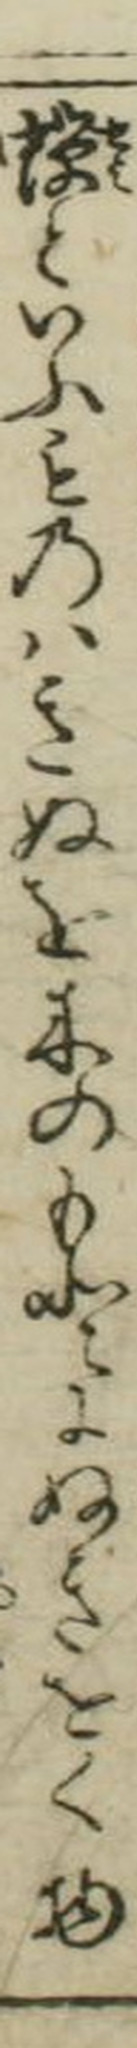蝉といふものはきぬを木のもとにぬきをく物
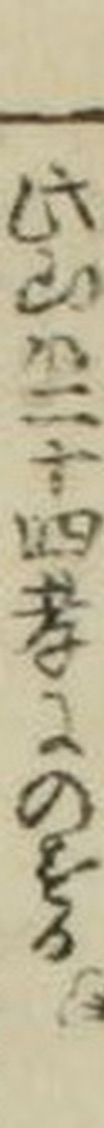此山は二十四孝にのする
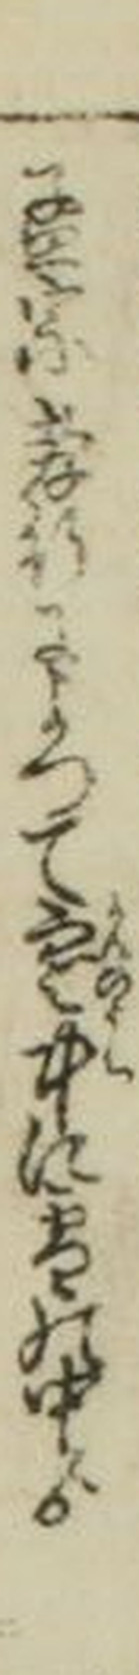孟宗孝行によつて寒中に雪の中より
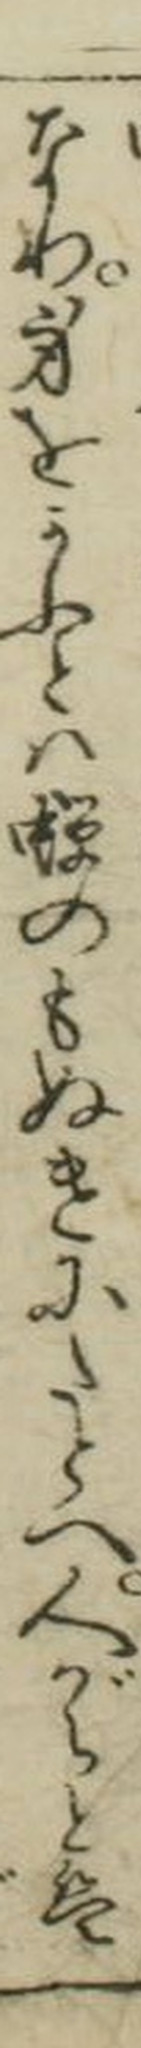なり。身をかふとは蝉のもぬけにたとへ。人がらとは
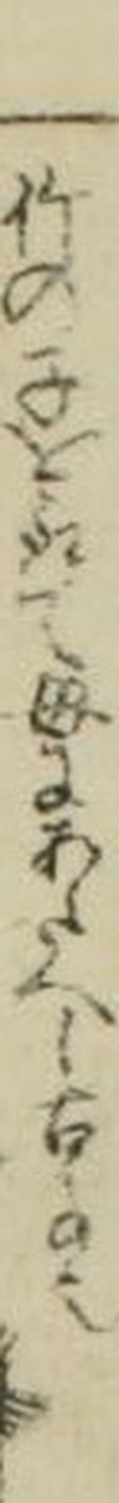竹の子を取て母にあたへし古事也
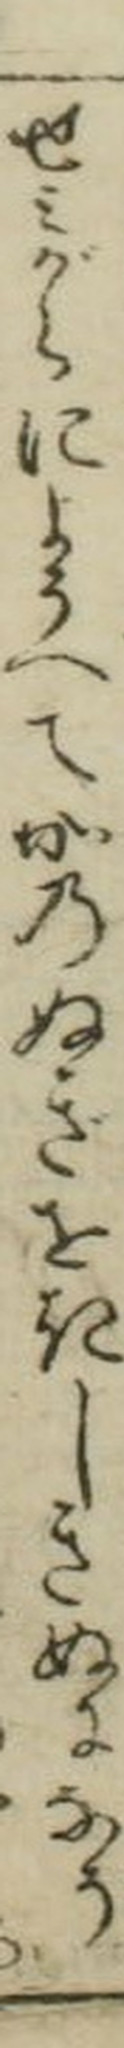せみがらによそへてかのぬぎをきしきぬになぞ
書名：女源氏教訓鑑
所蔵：東京学芸大学附属図書館
